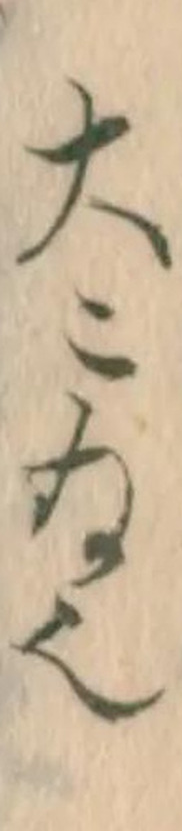大こゐ也
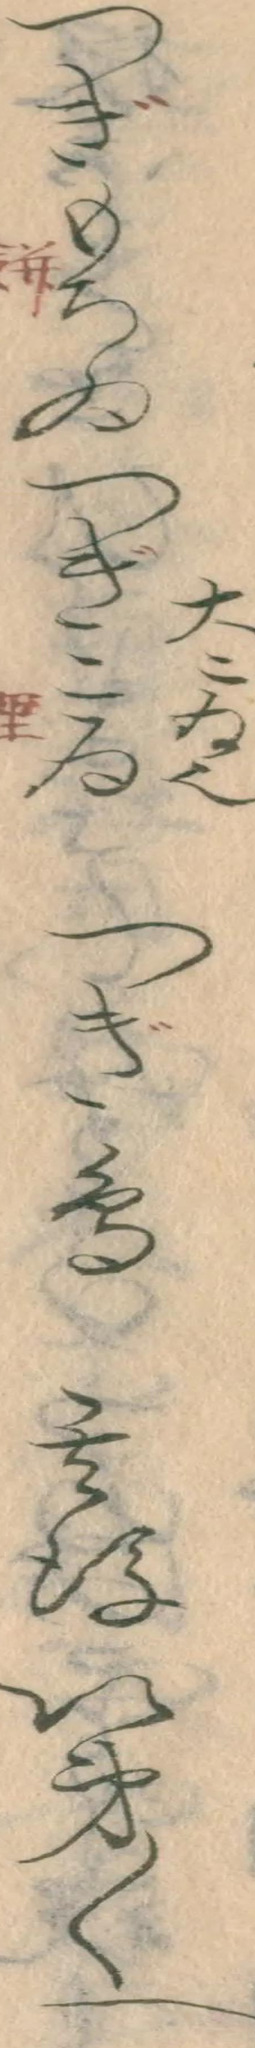つぎもちゐつぎこゐつぎ鳥其後次第〳〵
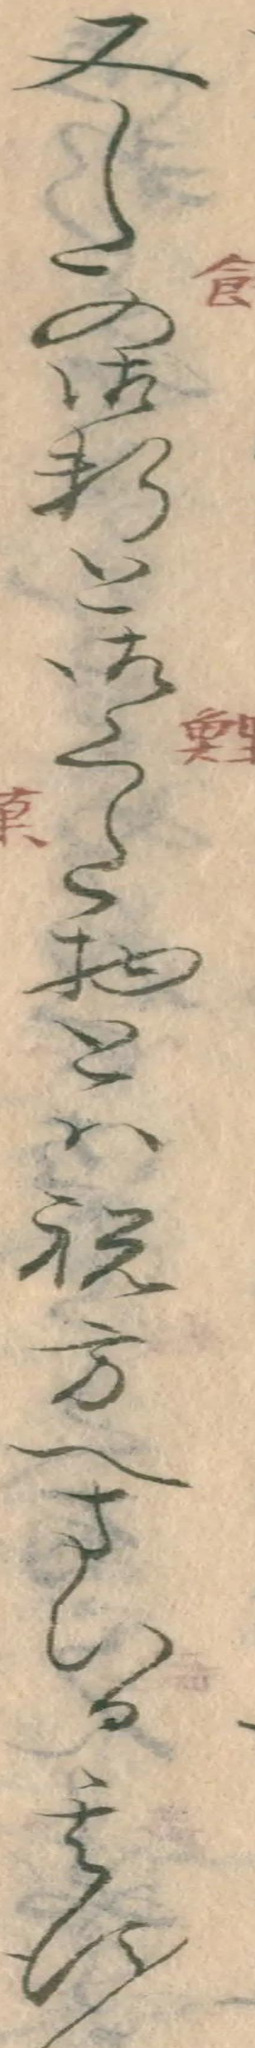又したの御料と御くた物とは祝方へまいる其後
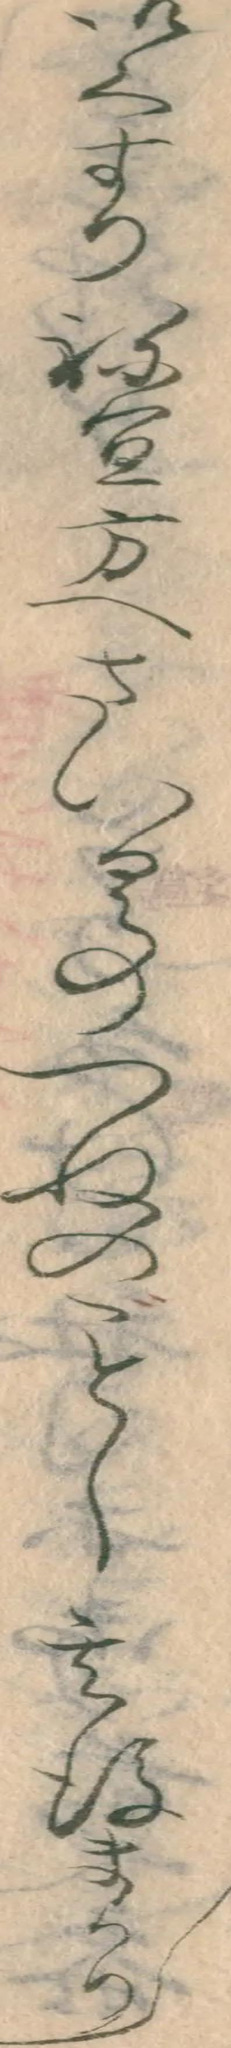御くすり祢宜方へまいる事つねのごとし其後まかり
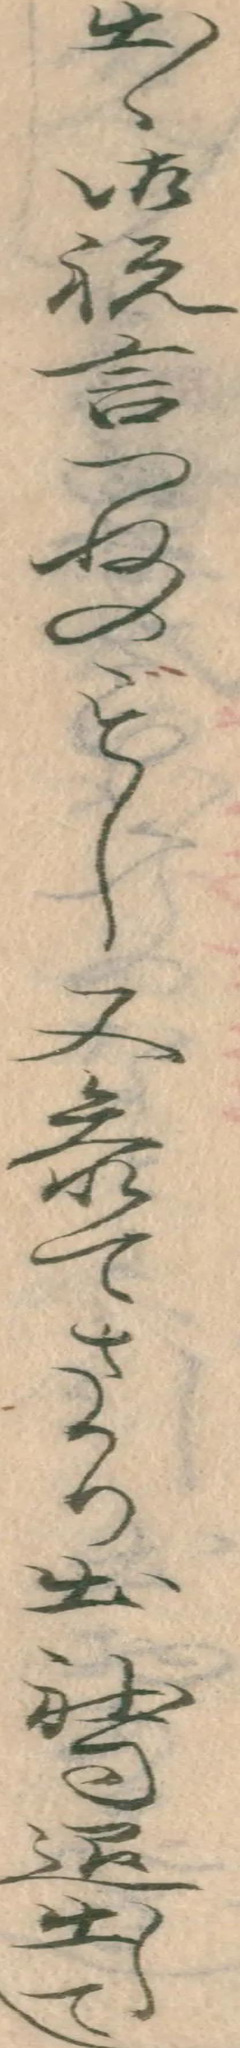出候御祝言つねのごとし又参てまかり出社司退出して
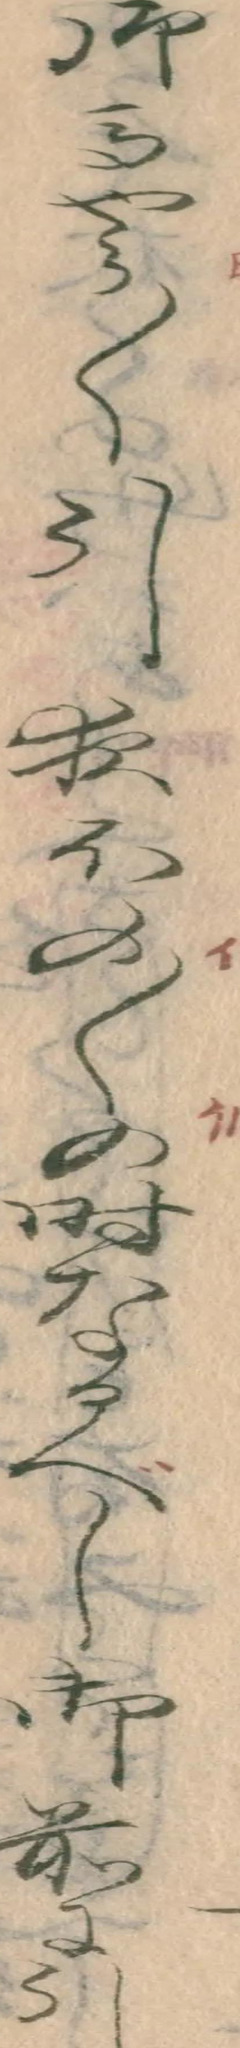御馬やう〳〵引夜ほの〳〵の時なるべし御前に引
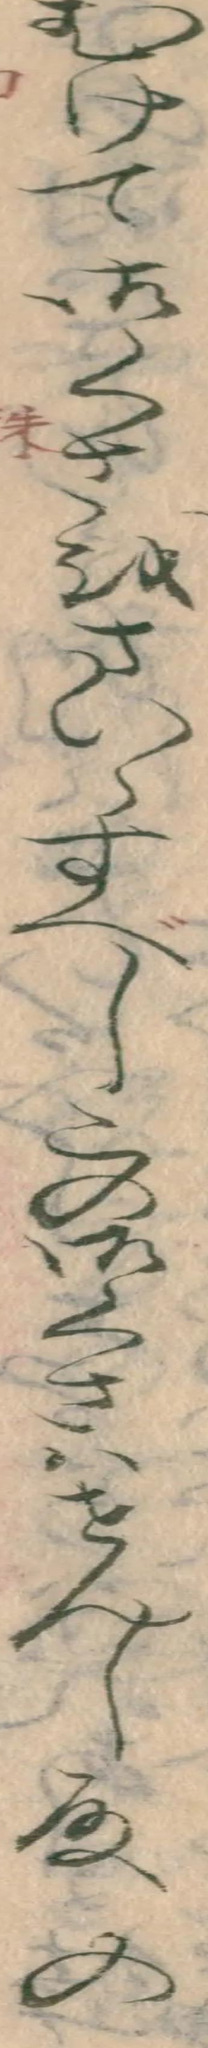むけて御くさをまいらすべしこの御くさはせんし殿の
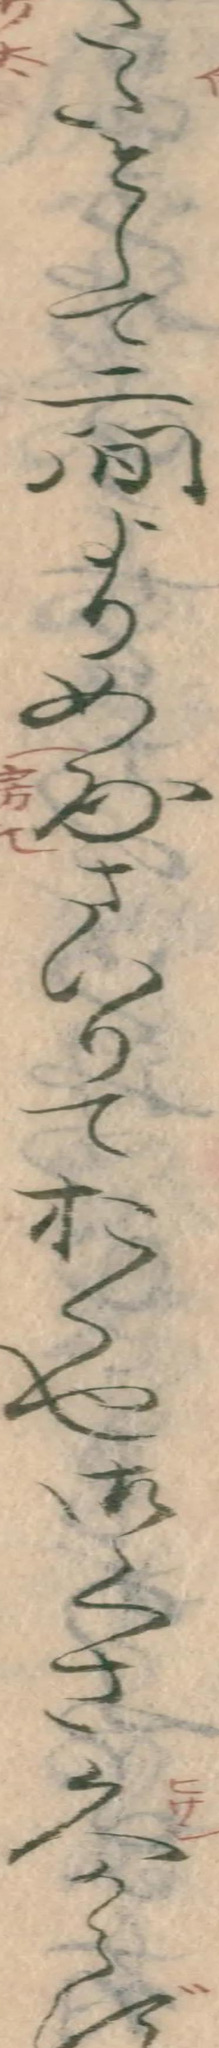さたとして二間よりめまいりておく也御くさ久からず
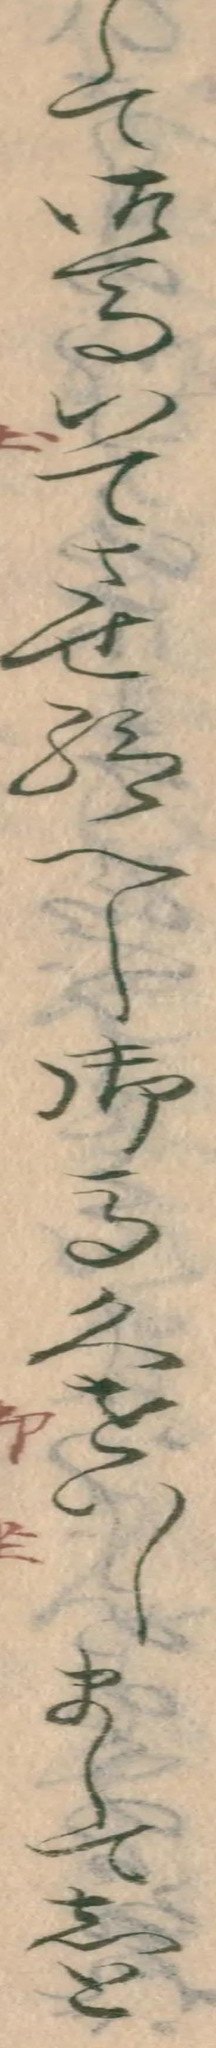して御馬いてさせ給へし御馬久をはしましてしと
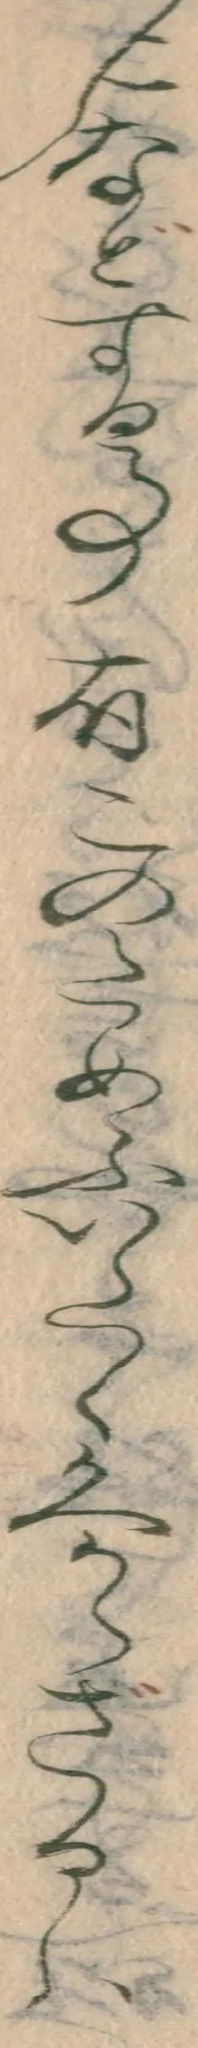などする事有このためふいたく久からざるは
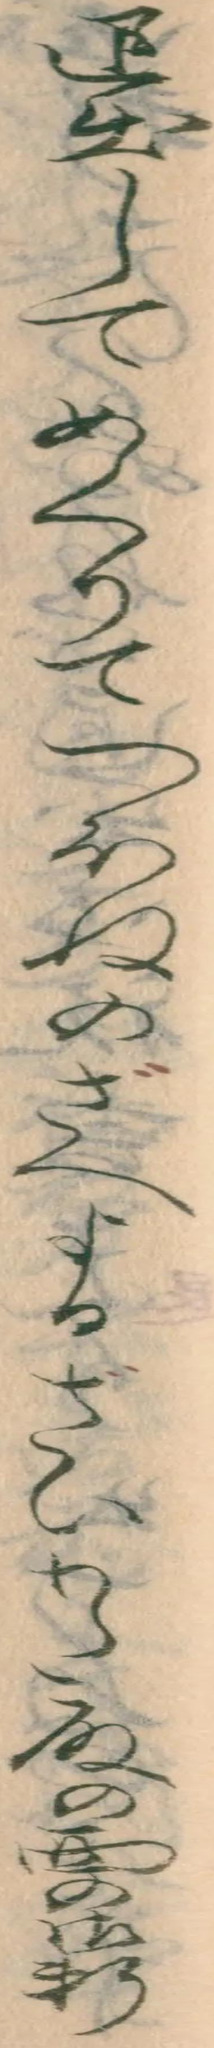退出してめくりてつほねのざへよるざいわた殿の西の御料
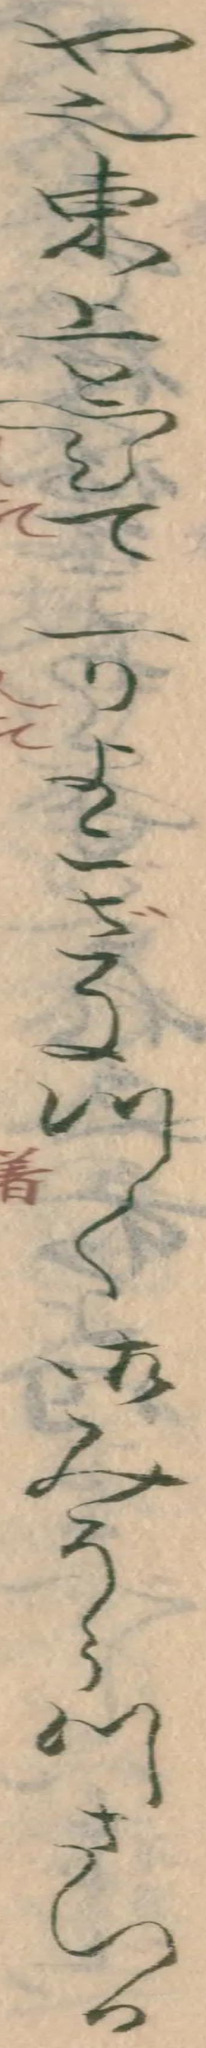や也東上をて一りよこざにつく御みそうつまいる
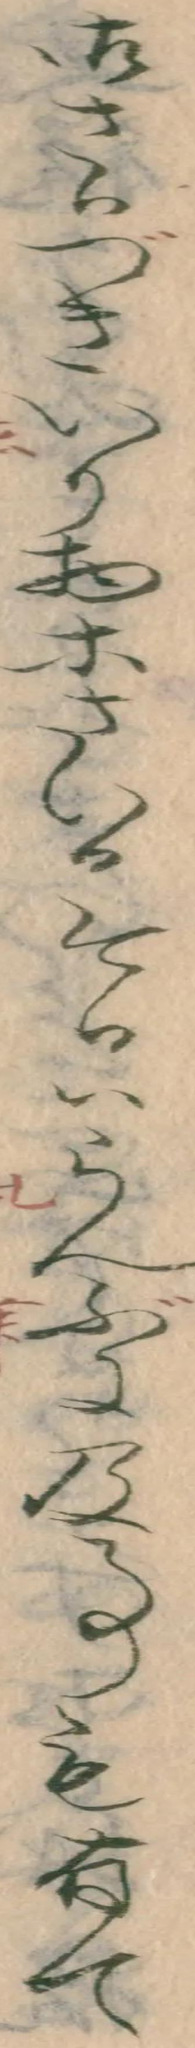御さかづきいり物等まいる今日はらんぶに及事も有て
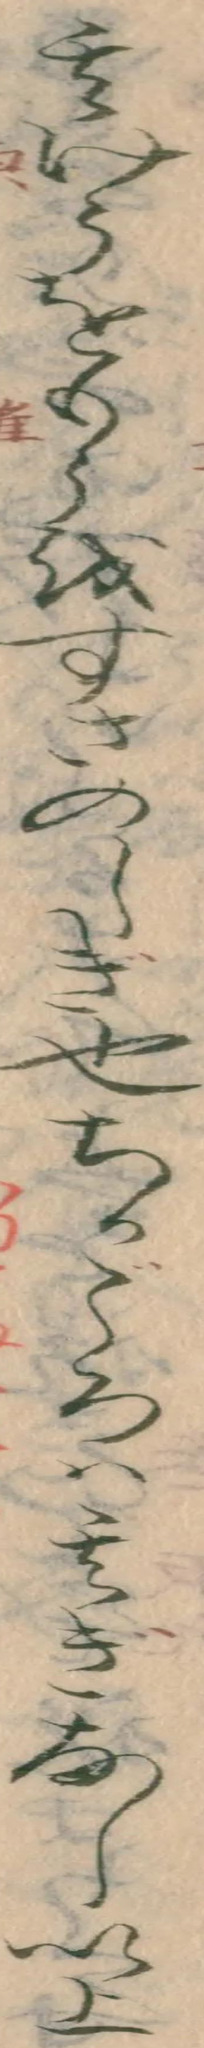其けうをもうをすさのしぎ也ちかごろは其ぎなし以上
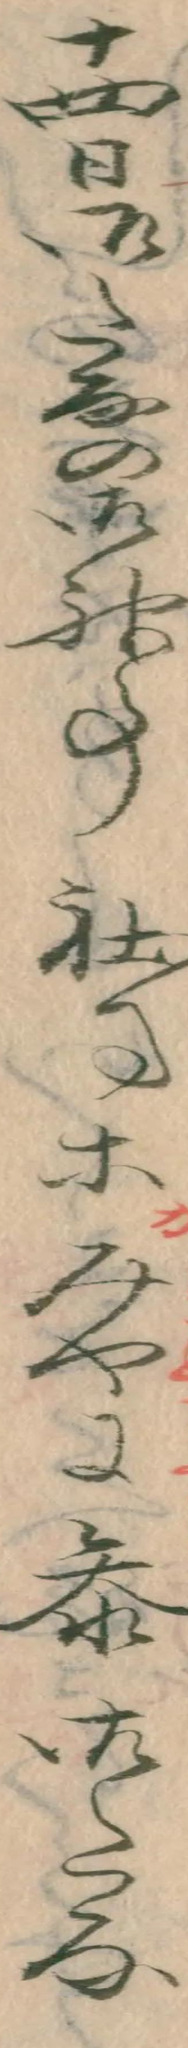一十四日御たなの御神事社司等みやに参御たな
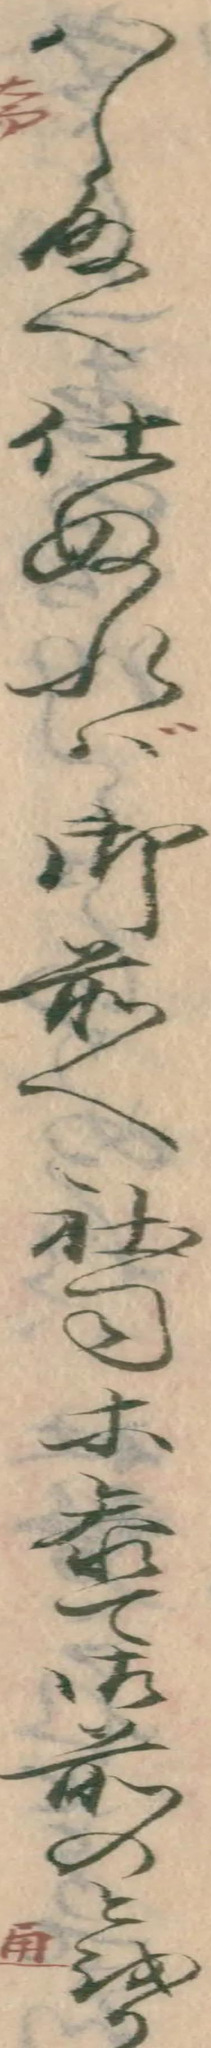はし殿へ仕ぬれば御前へ社司等参て御前のとをり
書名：賀茂社記録. 第3冊
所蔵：国立国会図書館 National Diet Library, JAPAN
